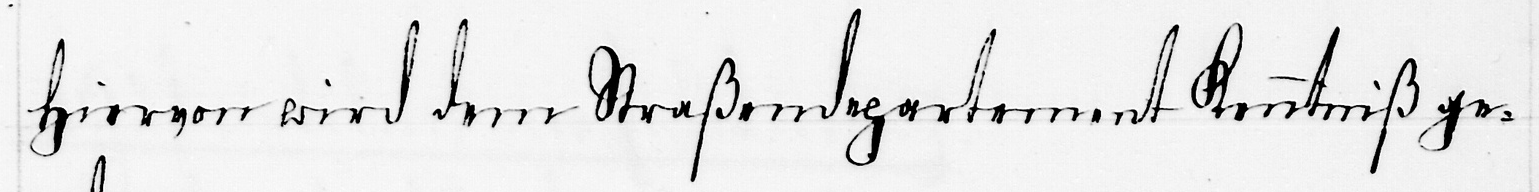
Hiervon wird dem Straßendepartement Kenntniß ge¬
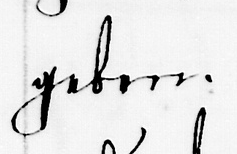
geben.
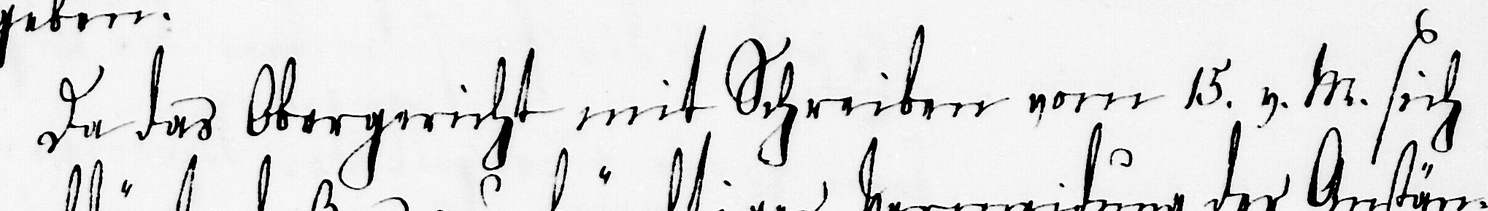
Da das Obergericht mit Schreiben vom 15. v. M. sich
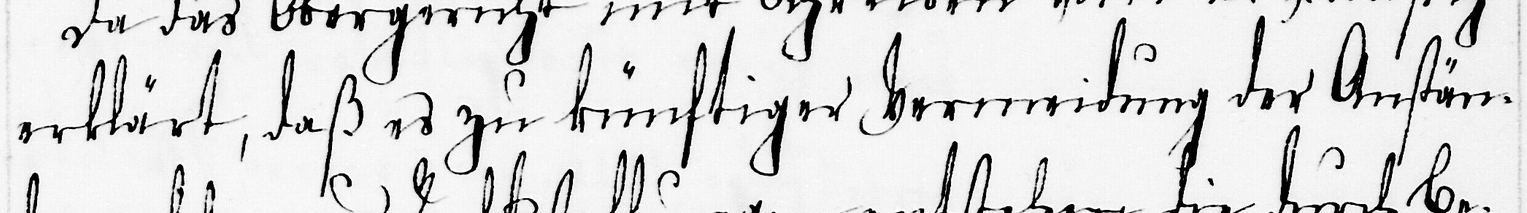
erklärt, daß es zu künftiger Vermeidung der Anstän¬
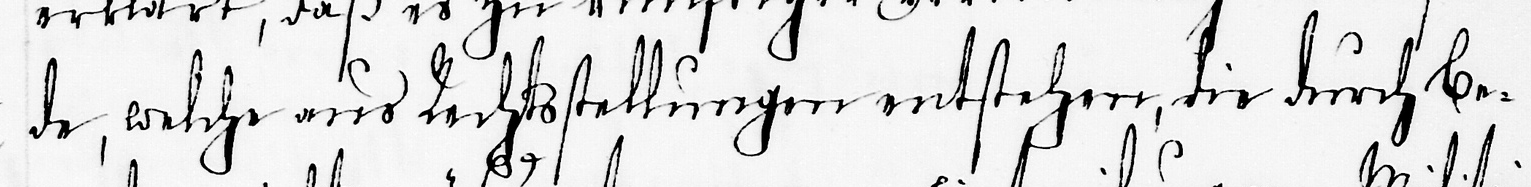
de, welche aus Rechtsstellungen entstehen, die durch Be¬
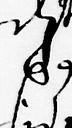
el¬
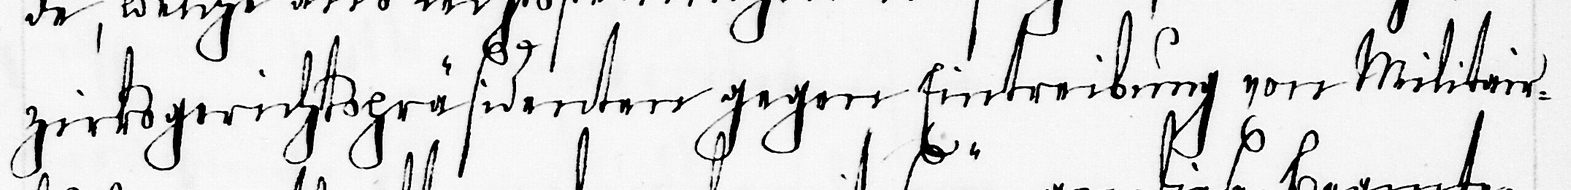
zirksgerichtspräsidenten gegen Eintreibung von Militair¬
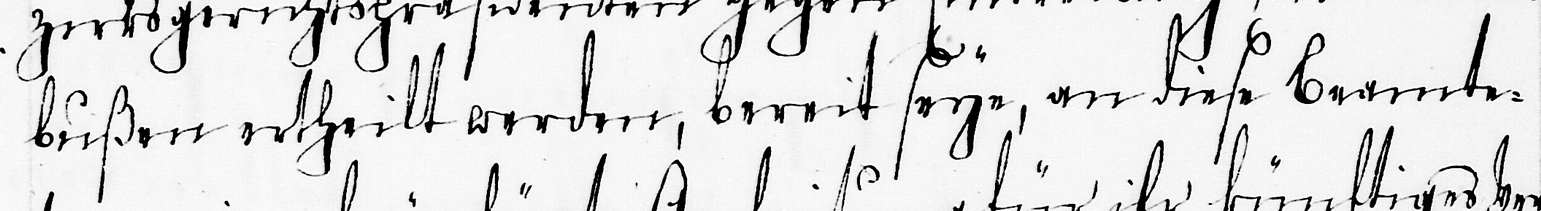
bußen ertheilt werden, bereit seye, an diese Beamte¬
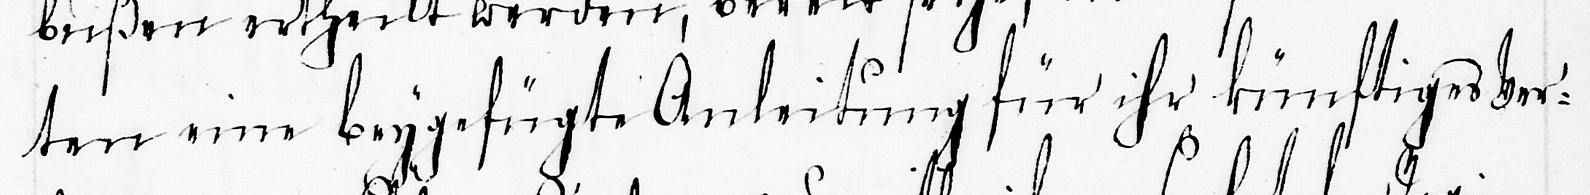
ten eine beygefügte Anleitung für ihr künftiges Ver¬
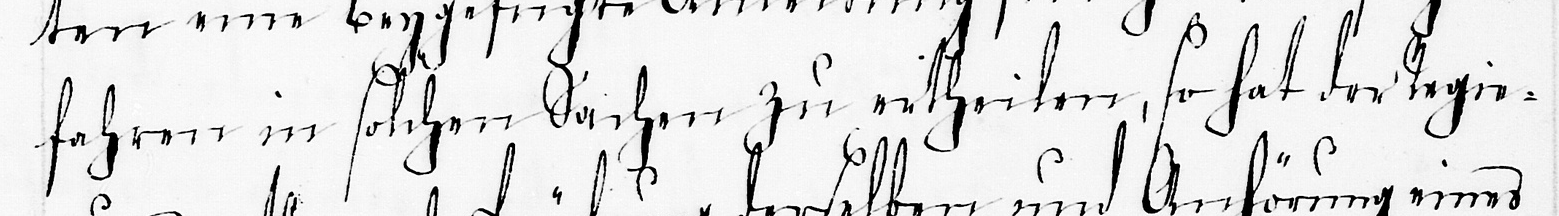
fahren in solchen Sachen zu ertheilen, so hat der Regie¬
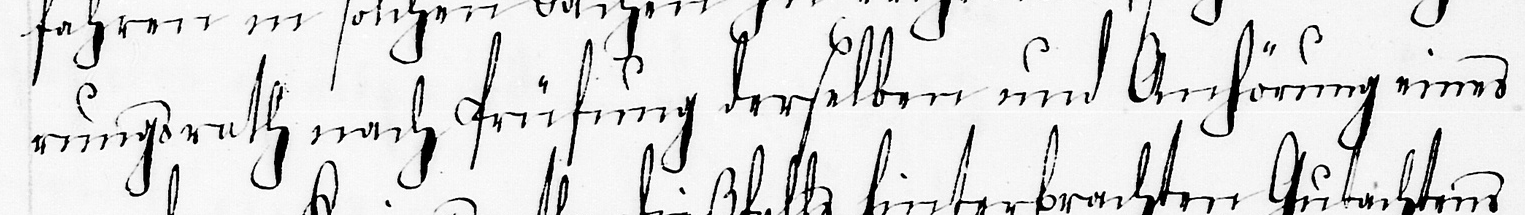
rungsrath nach Prüfung derselben und Anhörung eines
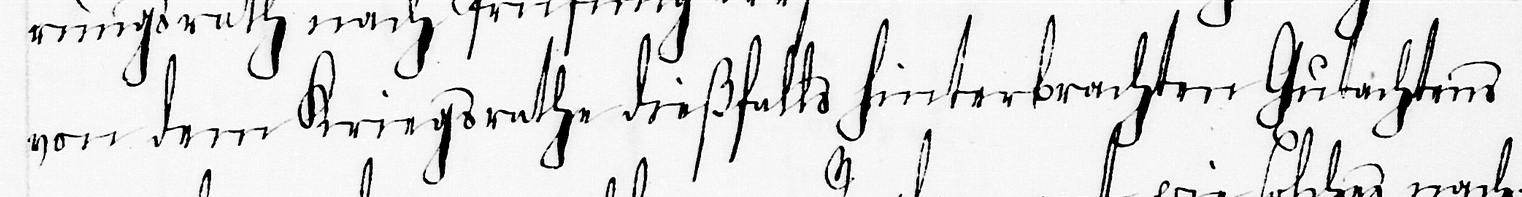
von dem Kriegsrathe dießfalls hinterbrachten Gutachtens
